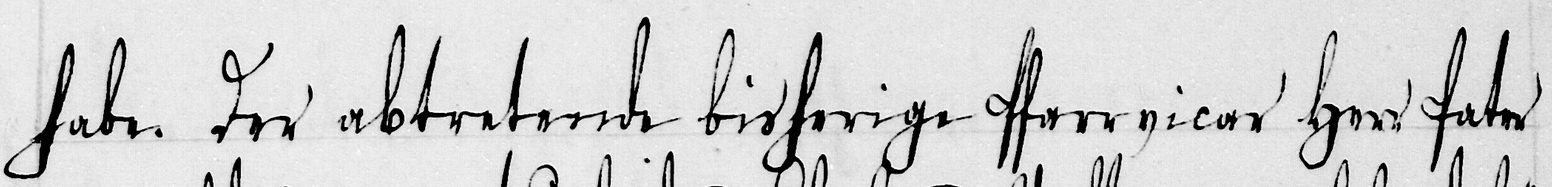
habe. Der abtretende bisherige Pfarrvicar Herr Pat¬
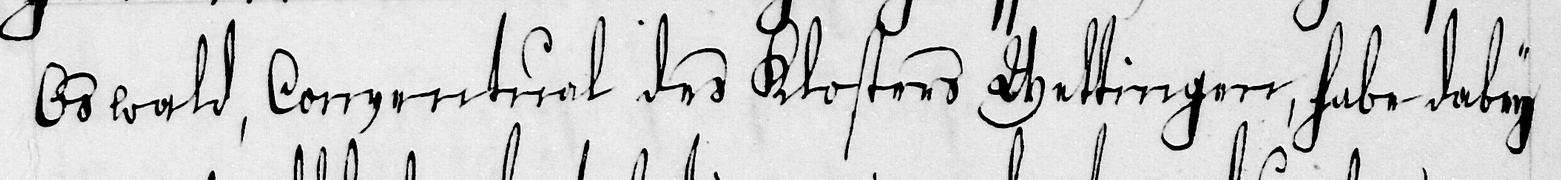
Oswald, Conventual des Klosters Wettingen, habe dabey
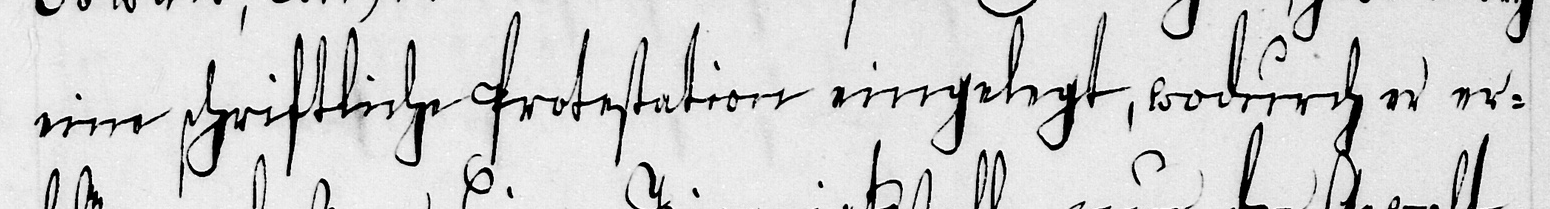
eine schriftliche Protestation eingelegt, wodurch er er¬
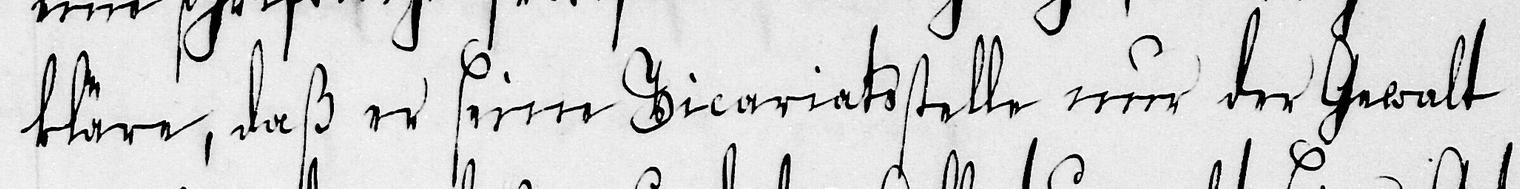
kläre, daß er seine Vicariatsstelle nur der Gewalt
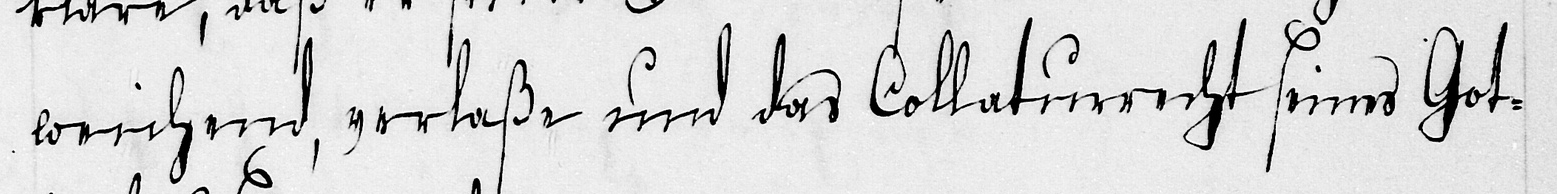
weichend, verlaße und das Collaturrecht seines Got¬
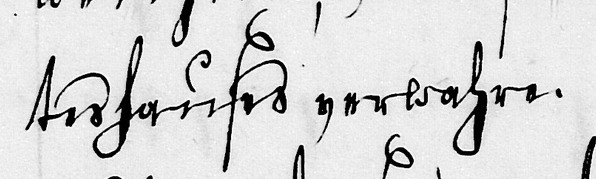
teshauses verwahre.
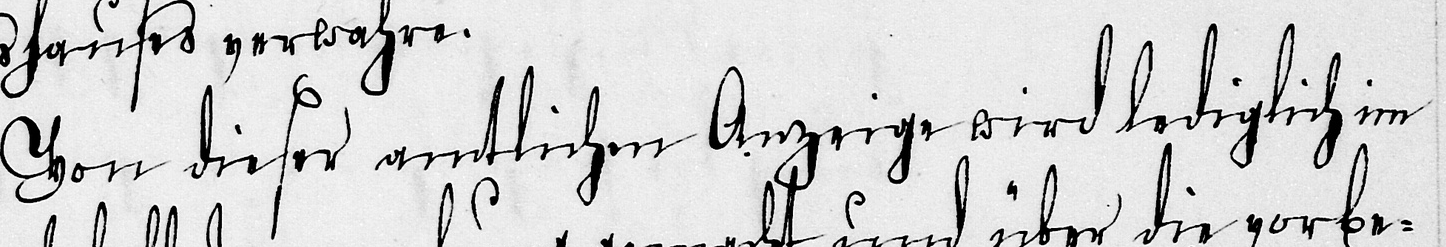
Von dieser amtlichen Anzeige wird lediglich im
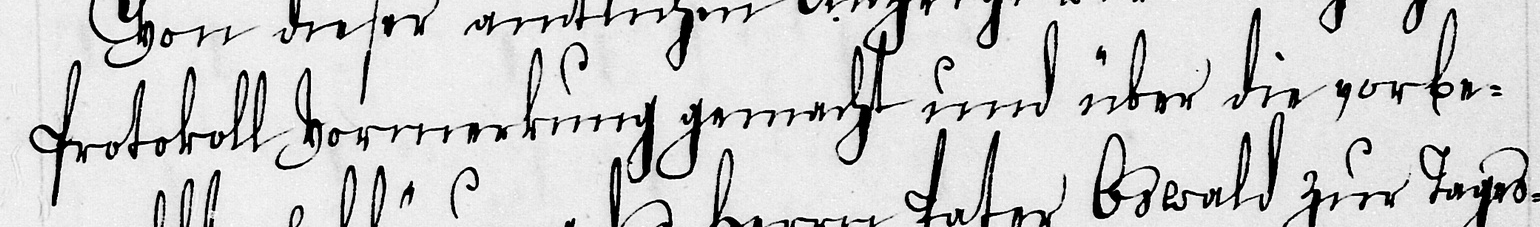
Protokoll Vormerkung gemacht und über die vorbe¬
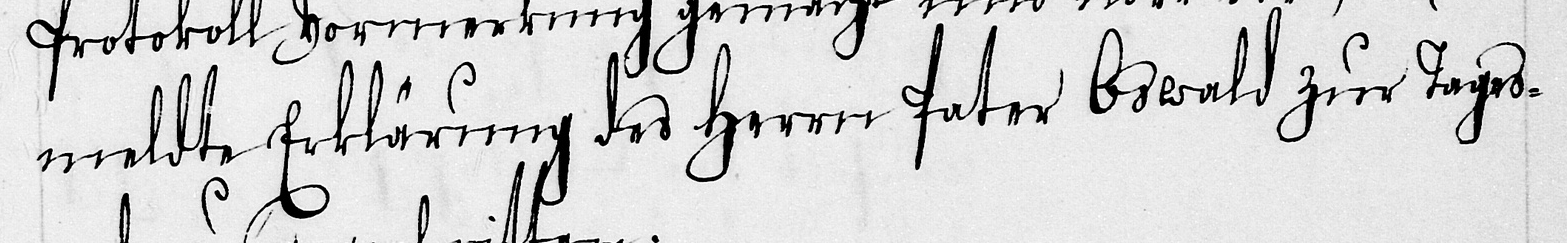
meldte Erklärung des Herrn Pater Oswald zur Tages¬
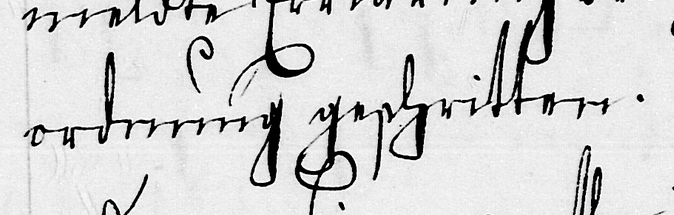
ordnung geschritten.
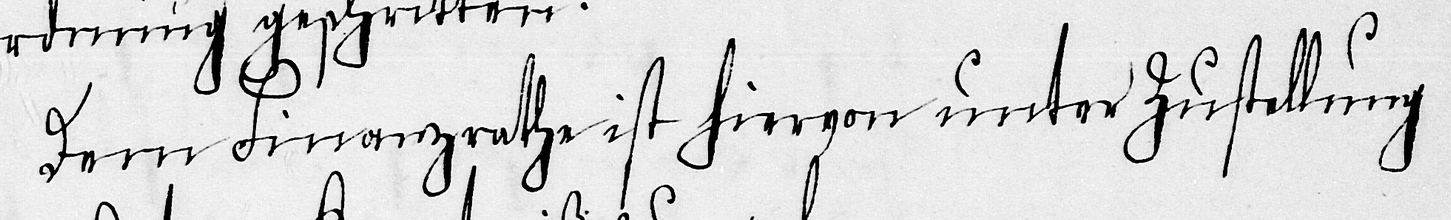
Dem Finanzrathe ist hiervon unter Zustellung
